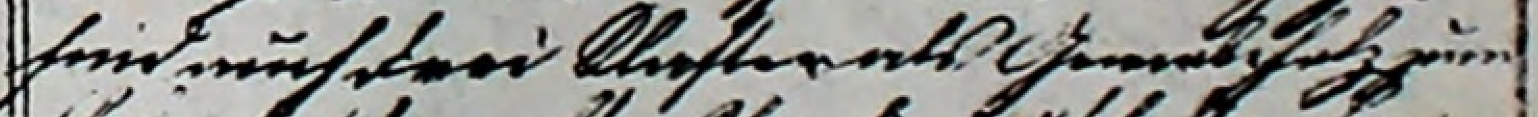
sind auch drei Klafter als Genensbeholz zum
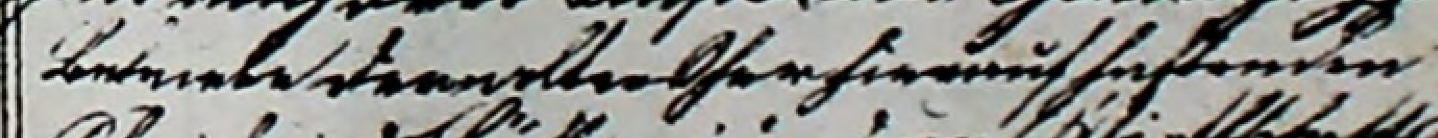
Betewen der alters her hierauf haften den
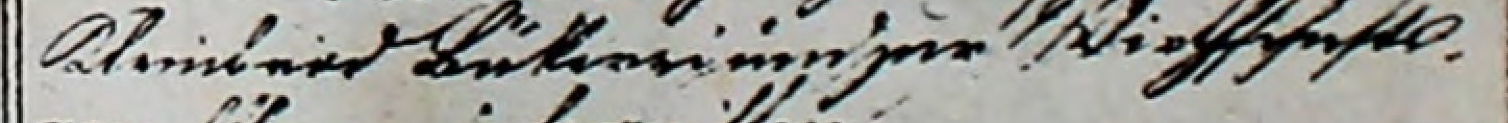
Kleinberd Bäkerei und zur Wirthschafts„
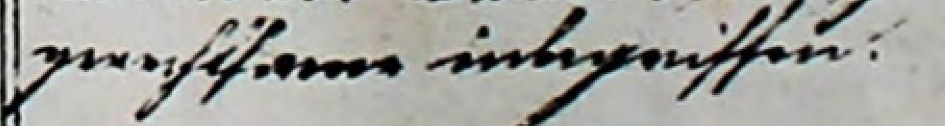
Gerechtsann inbegriffen.
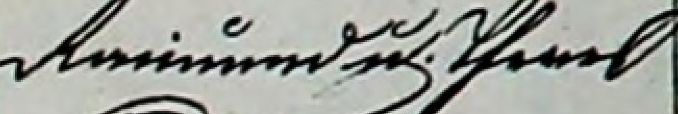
Raimund u. Theres
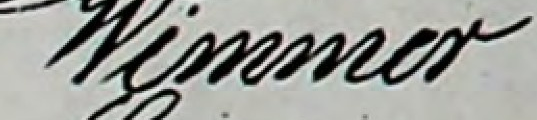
Wimmer
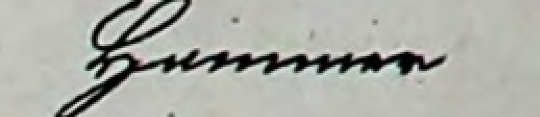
Hammer
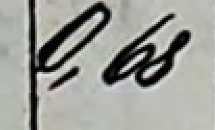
0,68
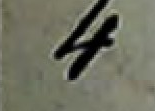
4
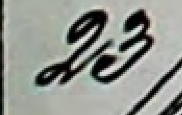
23
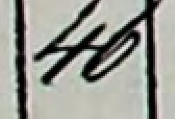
46
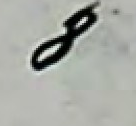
8
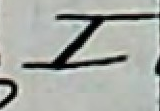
I
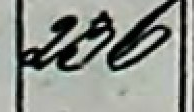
236
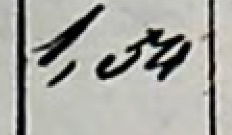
1,54
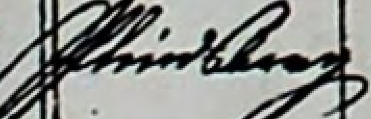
Pflindsberg
